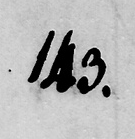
400.
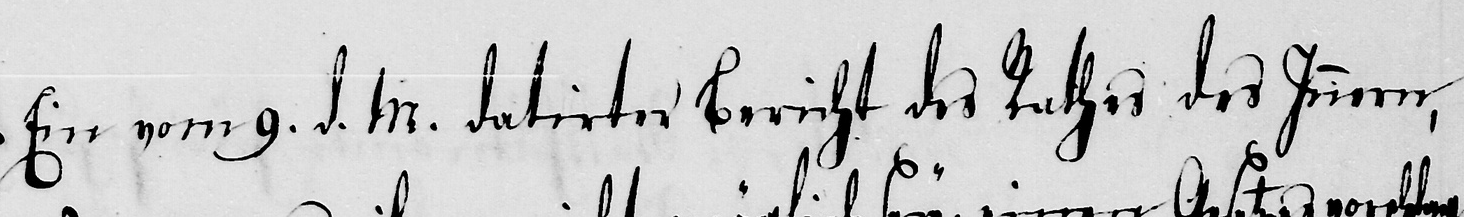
Ein vom 9. d. M. datirter Bericht des Rathes des Innern,
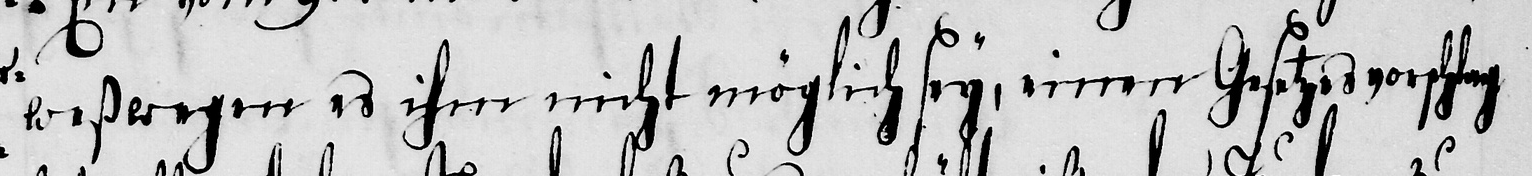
weßwegen es ihm nicht möglich sey, einen Gesetzesvorschlag
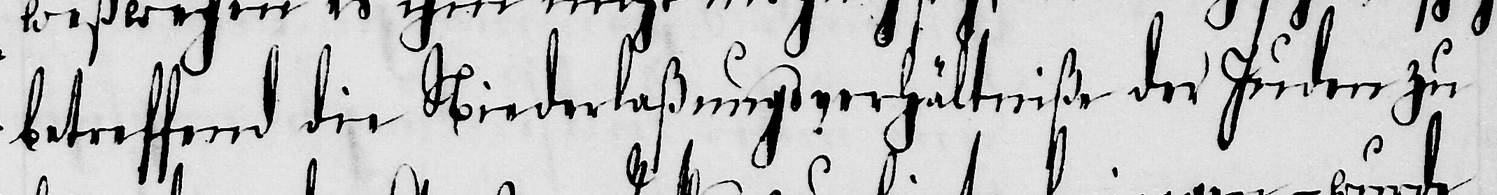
betreffend die Niederlaßungsverhältniße der Juden zu
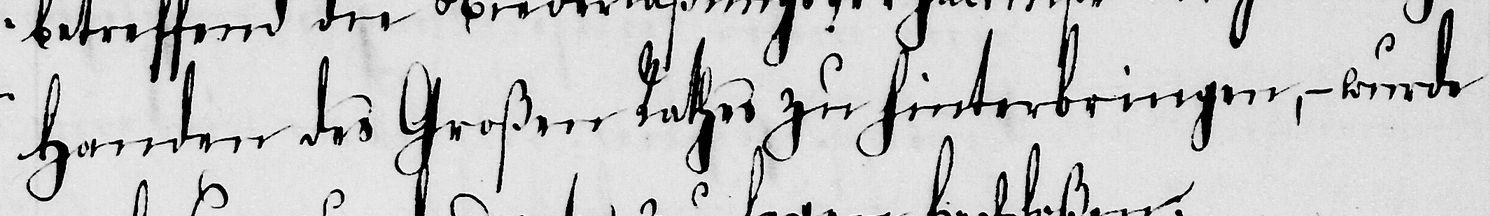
Handen des Großen Rathes zu hinterbringen, – wurde
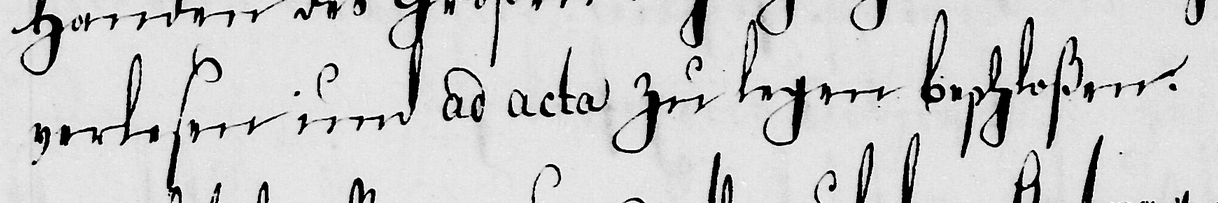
verlesen und ad acta zu legen beschloßen.
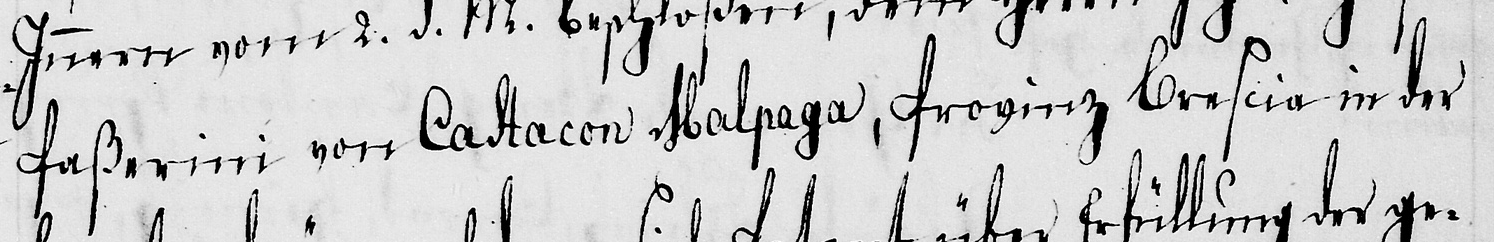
Paßerini von Castacon Malpaga, Provinz Brescia in der
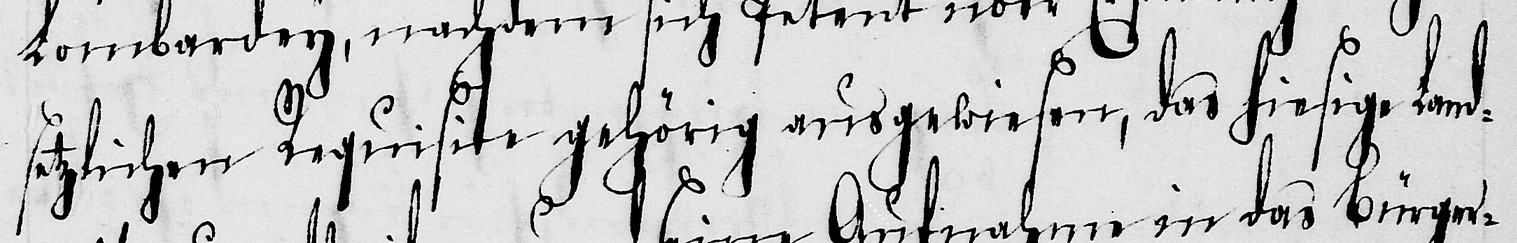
etzlichen Requisite gehörig ausgewiesen, das hiesige Lan¬
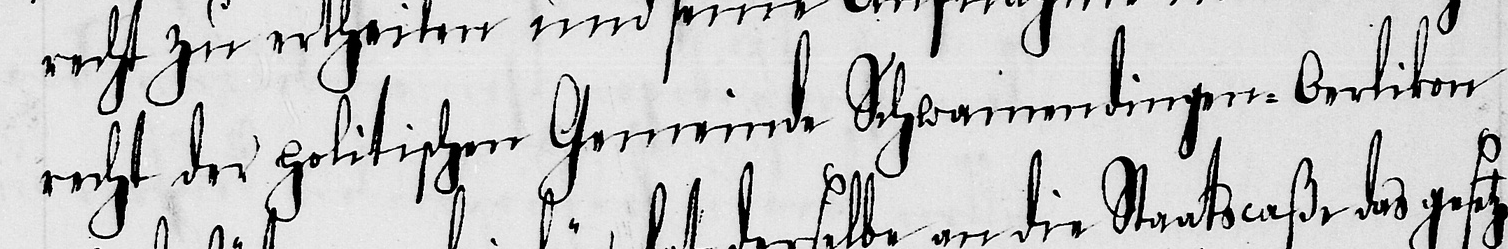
recht der politischen Gemeinde Schwamendingen-Oerlikon
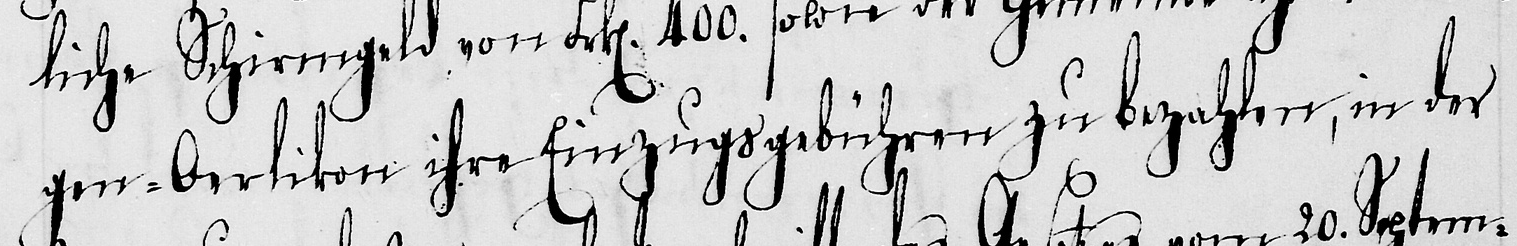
gen-Oerlikon ihre Einzugsgebühren zu bezahlen, in der
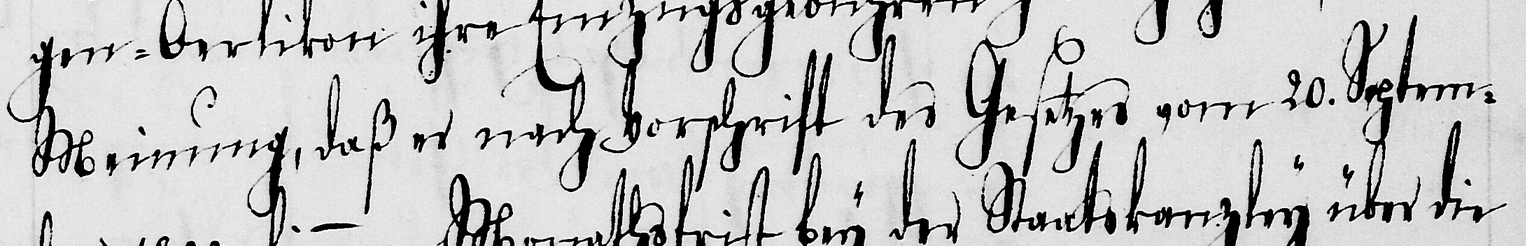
Meinung, daß er nach Vorschrift des Gesetzes vom 20. Septem¬
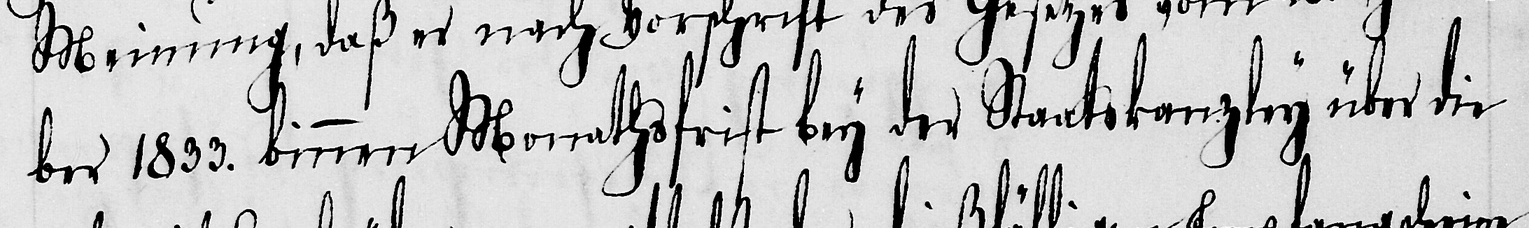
ber 1833. binnen Monathsfrist bey der Staatskanzley über die
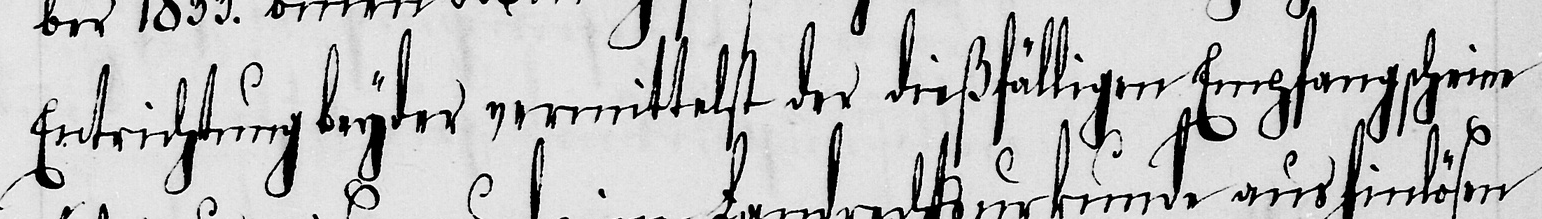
Entrichtung beyder vermittelst der dießfälligen Empfangscheine
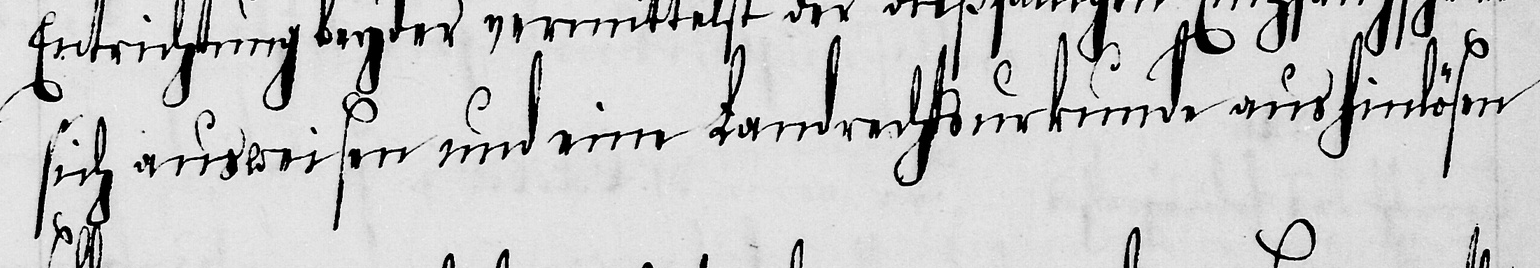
sich ausweisen und eine Landrechtsurkunde aushinlösen
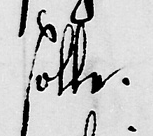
solle.
